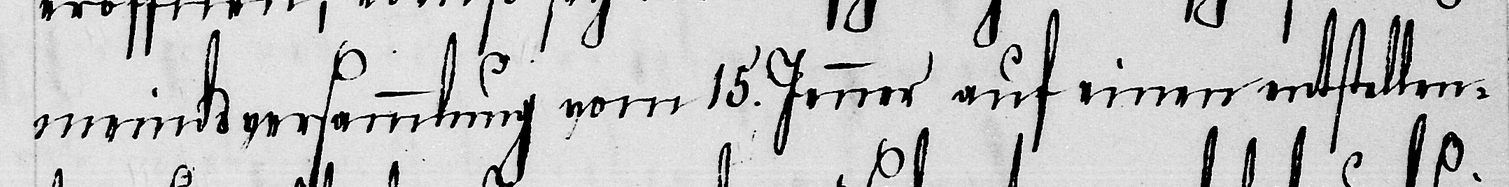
meindsversammlung vom 15. Jenner auf einen entstellen¬
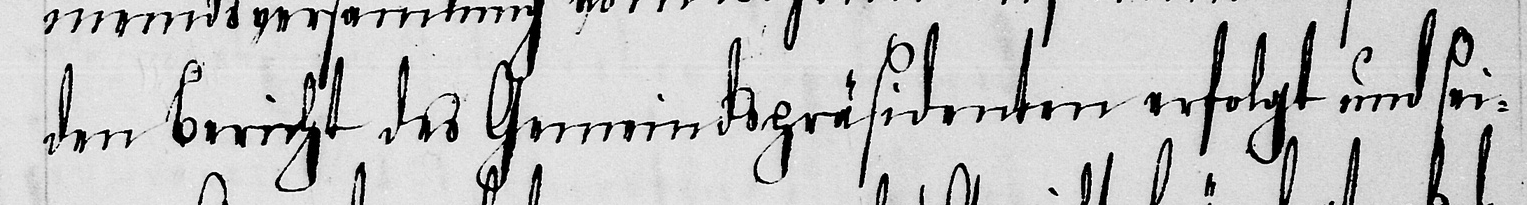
den Bericht des Gemeindspräsidenten erfolgt und sei¬
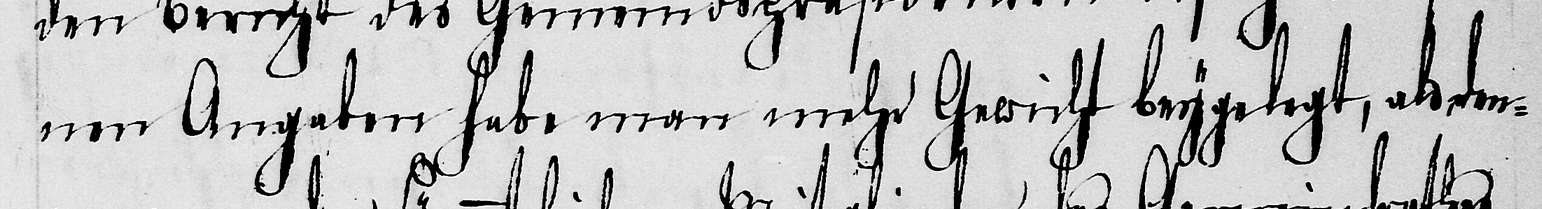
nen Angaben habe man mehr Gewicht beygelegt, als de¬
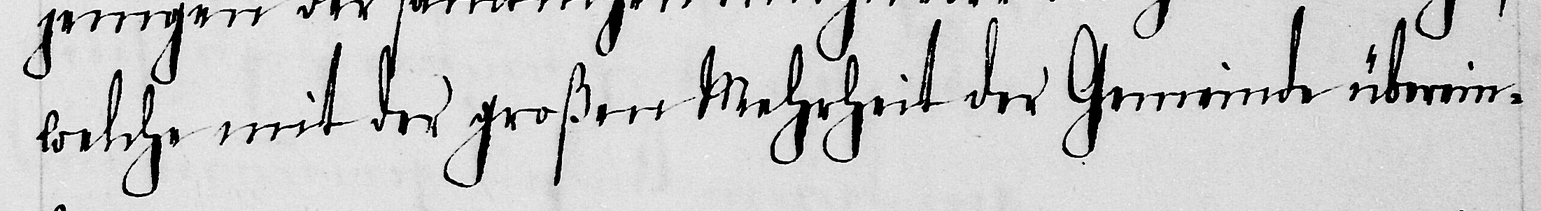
welche mit der großen Mehrheit der Gemeinde überein¬
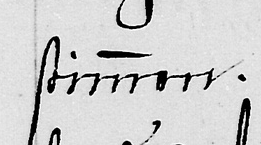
stimmen.
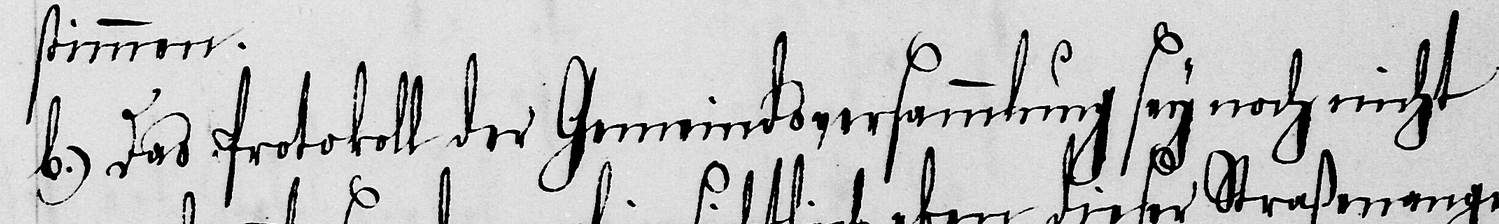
Das Protokoll der Gemeindsversammlung sey noch
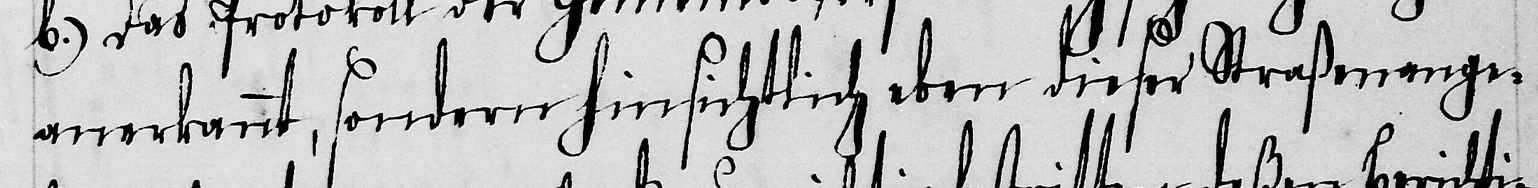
anerkannt, sondern hinsichtlich eben dieser Straßenange¬
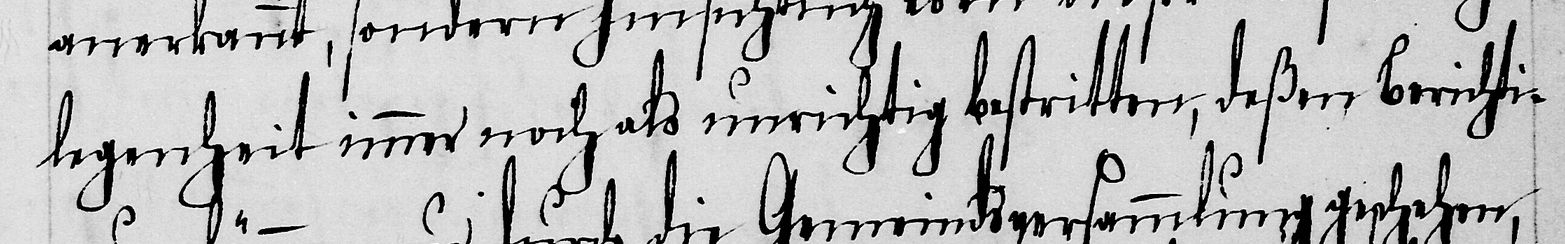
legenheit immer noch als unrichtig bestritten, deßen Berichti¬
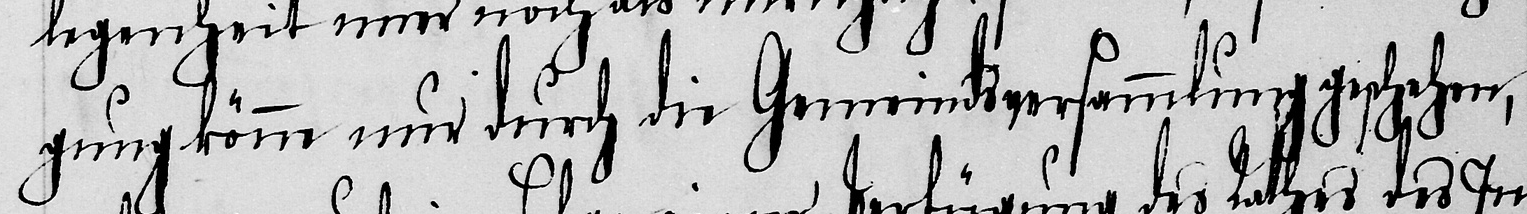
gung könne nur durch die Gemeindsversammlung geschehen,
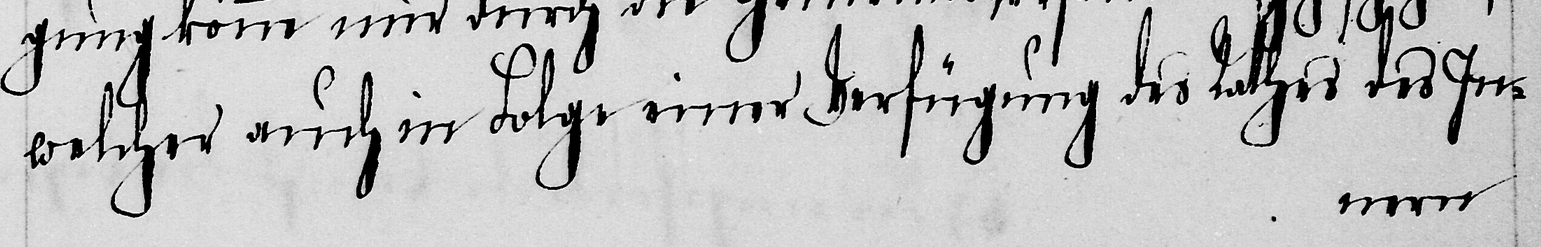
welcher auch in Folge einer Verfügung des Rathes des In-
